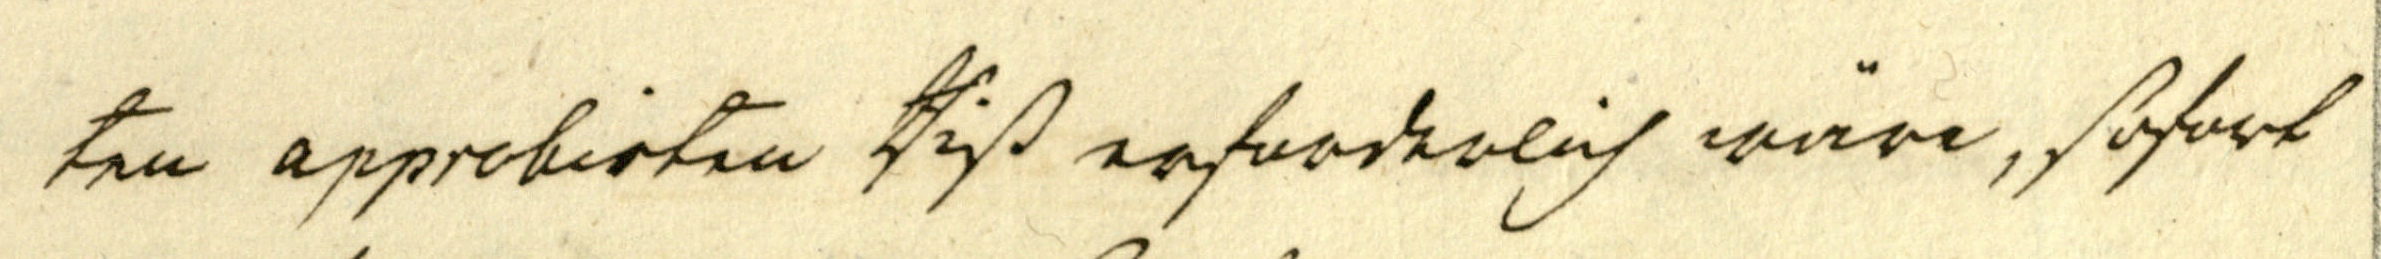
ten approbirten Riß erforderlich wäre, sofort
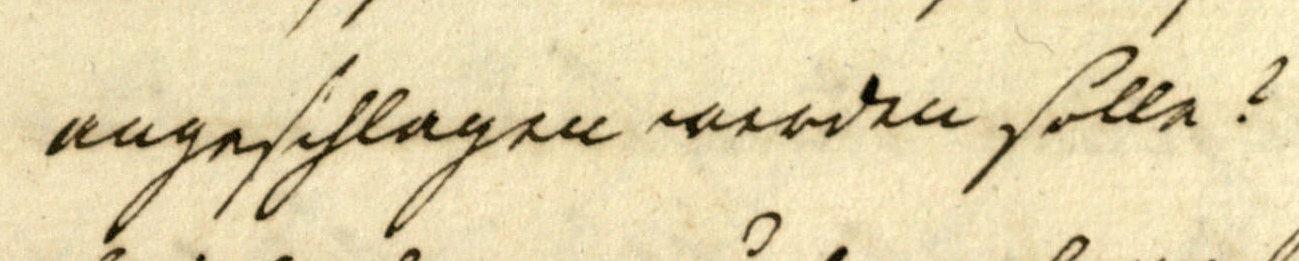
angeschlagen werden solle?
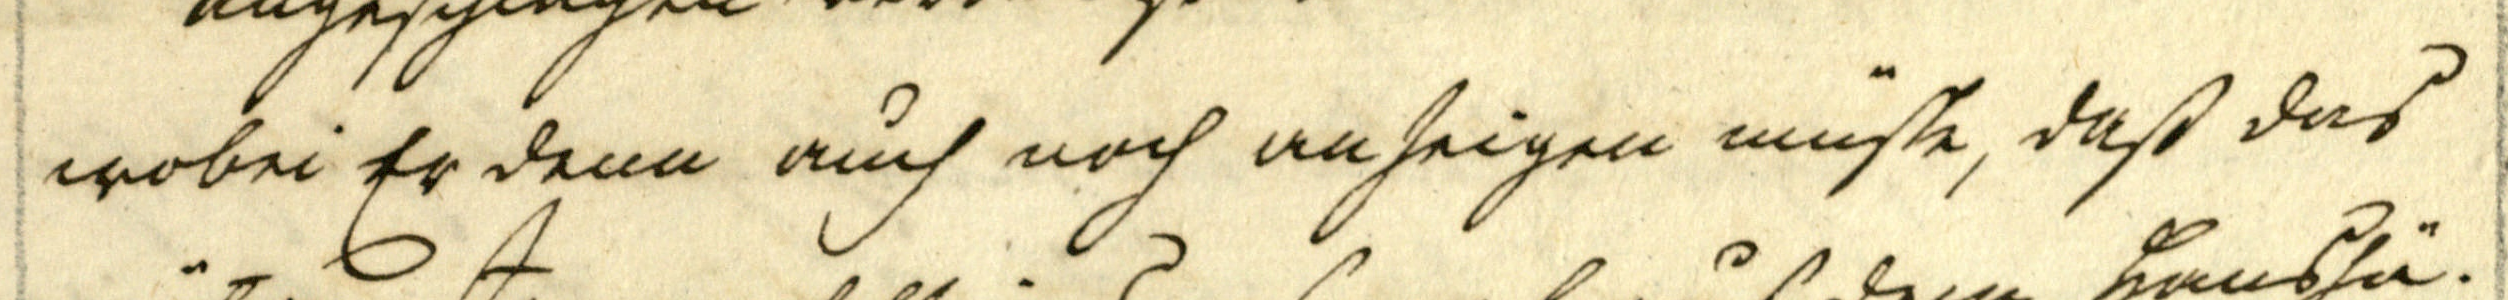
wobei Er denn auch noch anzeigen müsse, daß das
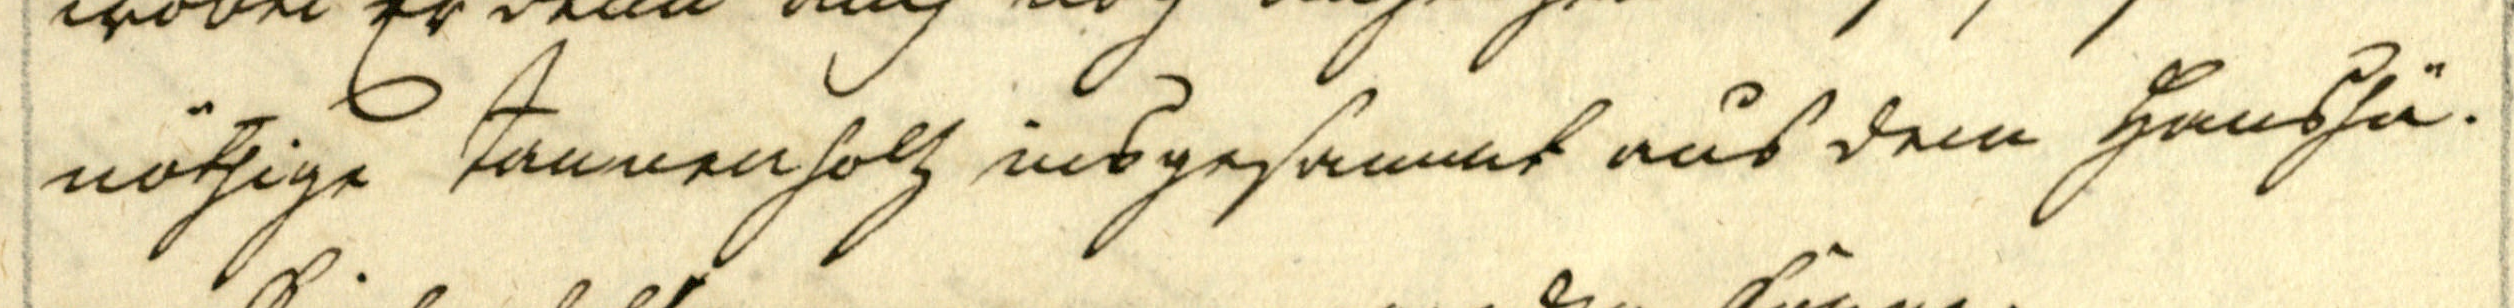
nöthige Tannenholz insgesammt aus dem Hanshä¬
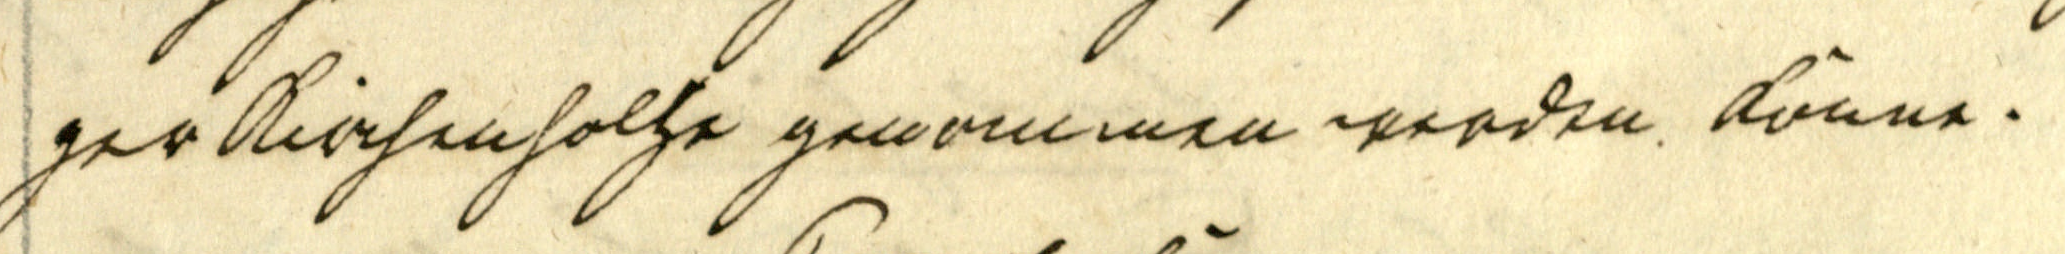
ger Kirchenholze genommen werden könne.
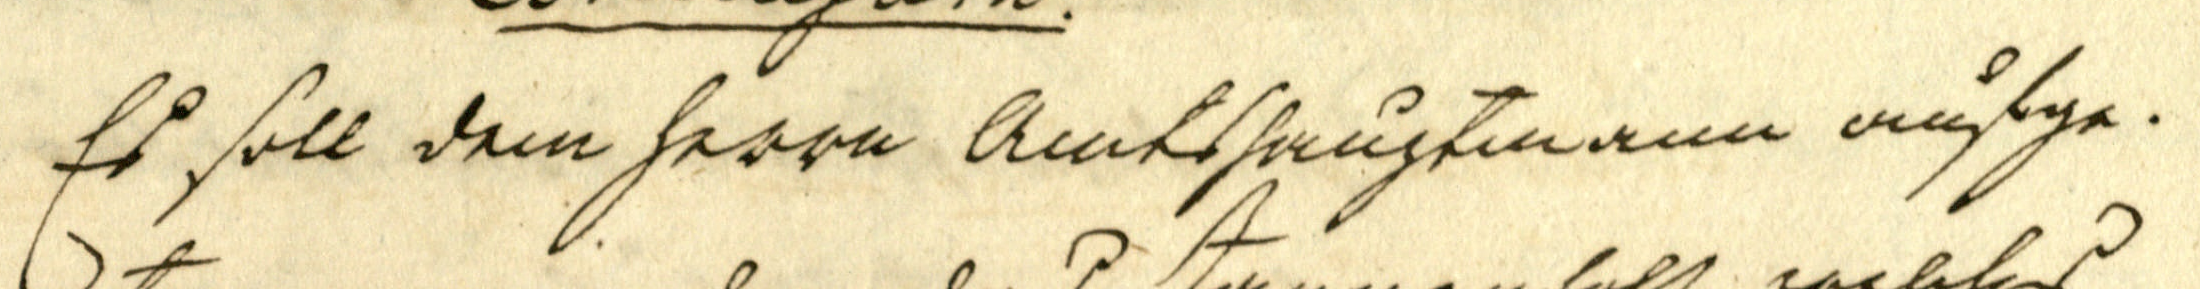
Es soll dem Herrn Amtshauptmann aufge¬
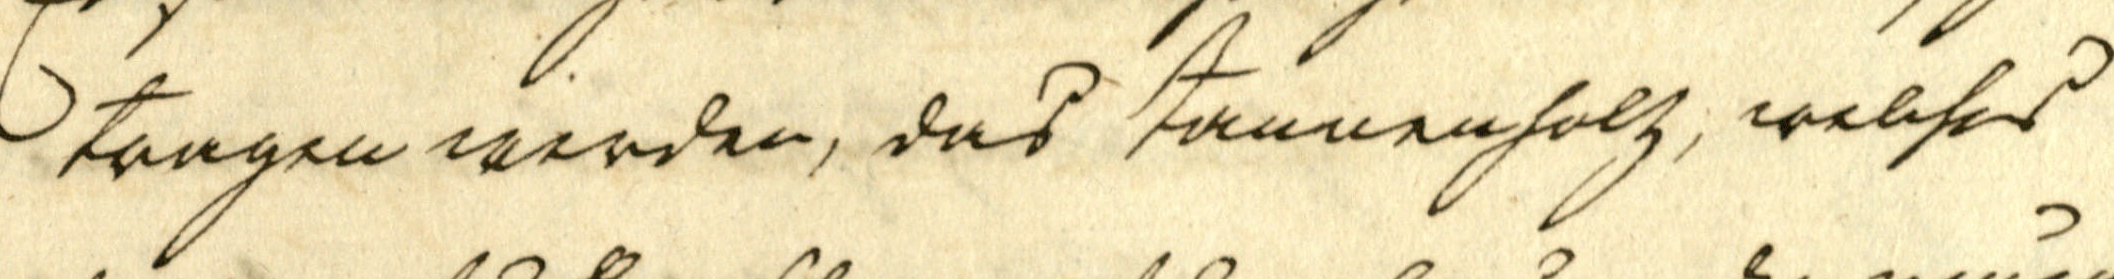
tragen werden, das Tannenholz, welches
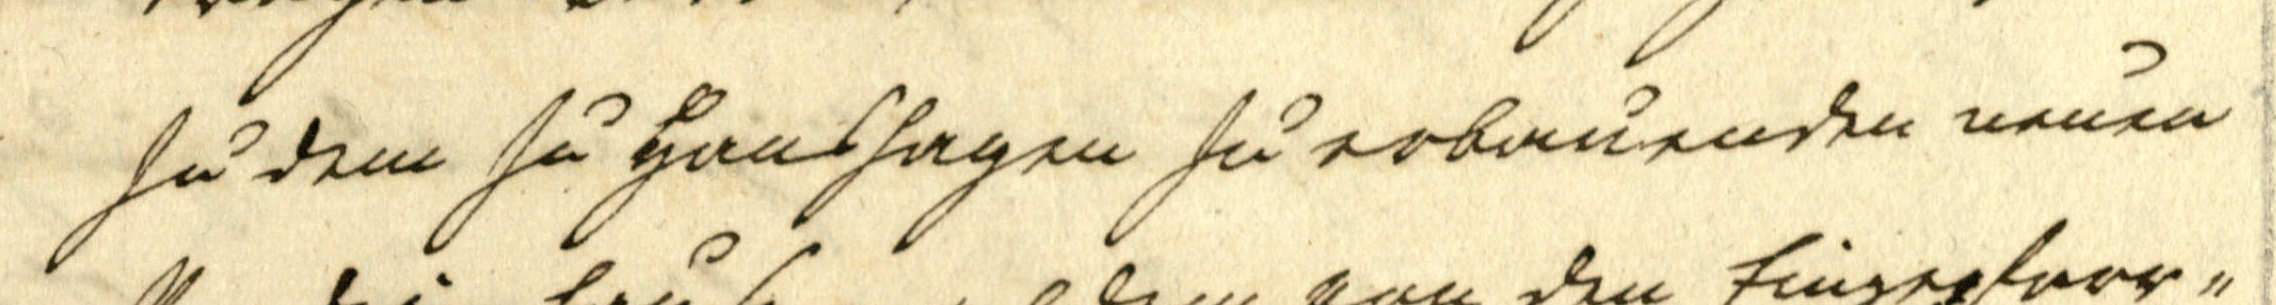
zu dem zu Hanshagen zu erbauenden neuen
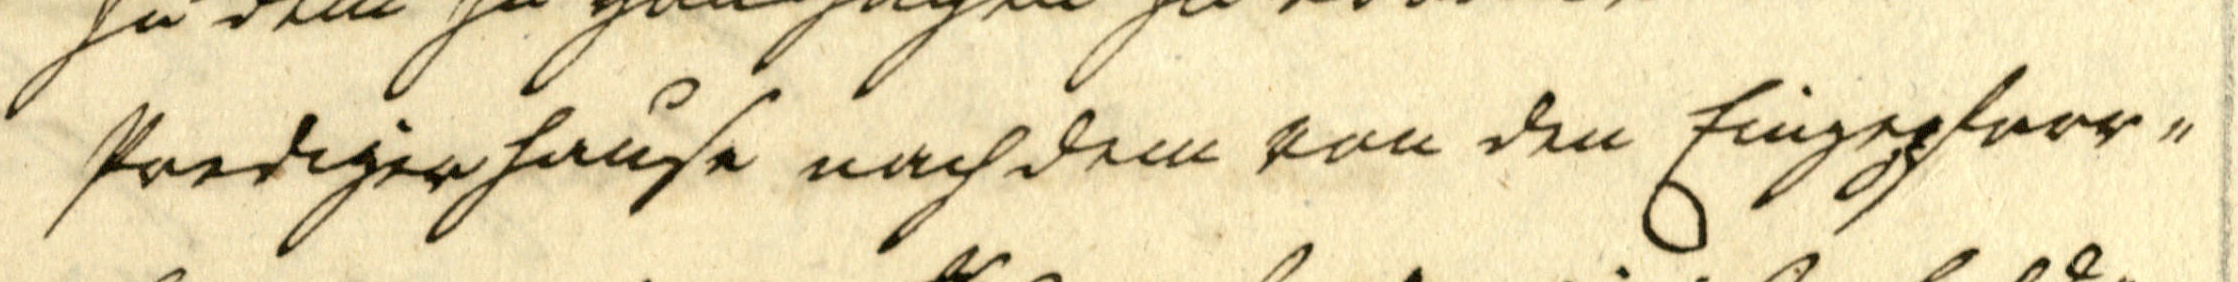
Predigerhause nach dem von den Eingepfarr¬
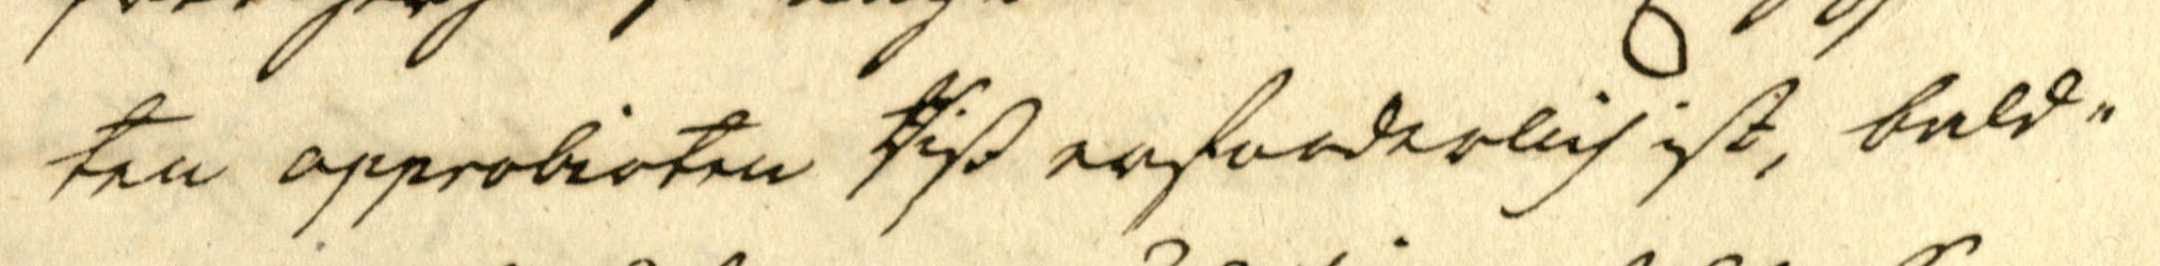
ten approbirten Riß erforderlich ist, bald¬
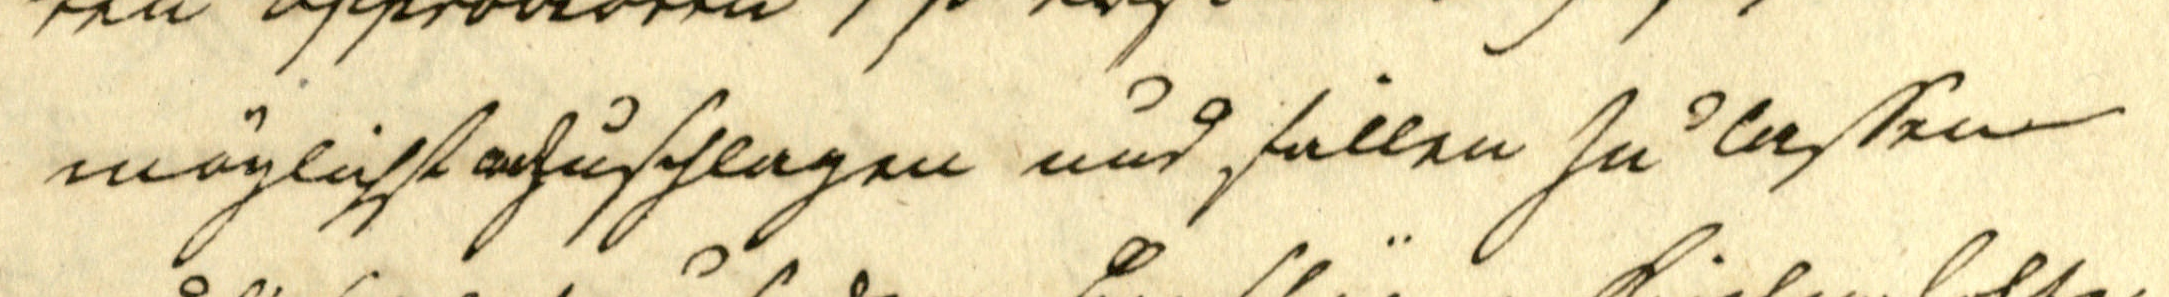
möglichst anzuschlagen und fällen zu lassen
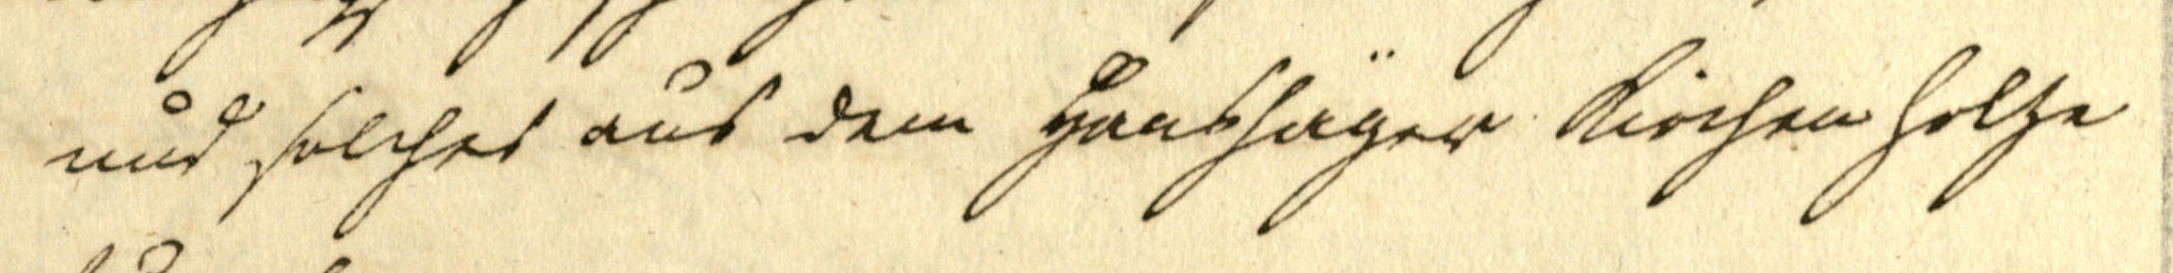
und solches aus dem Hanshäger Kirchen Holze
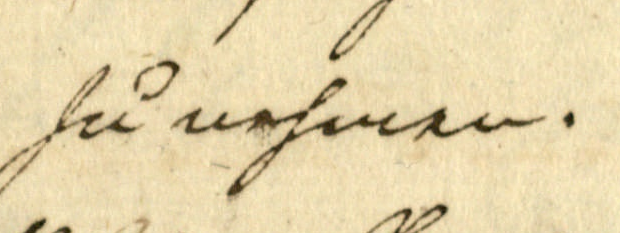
zu nehmen.
